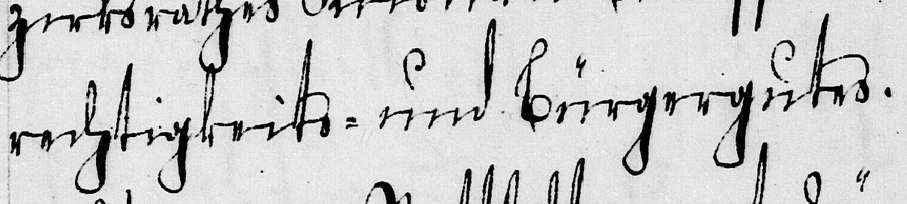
rechtigkeits- und Bürgergutes.
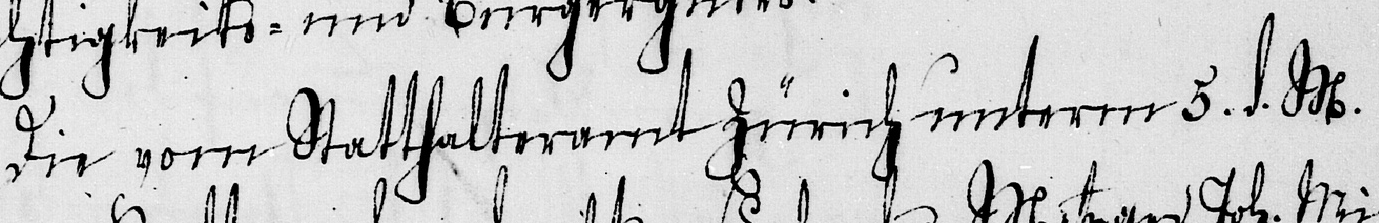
Die vom Statthalteramt Zürich unterm 5. d. M.
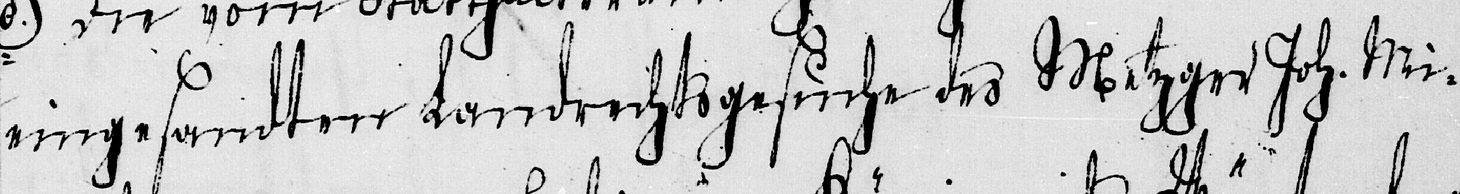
eingesandten Landrechtsgesuche des Metzger Joh. Mi¬
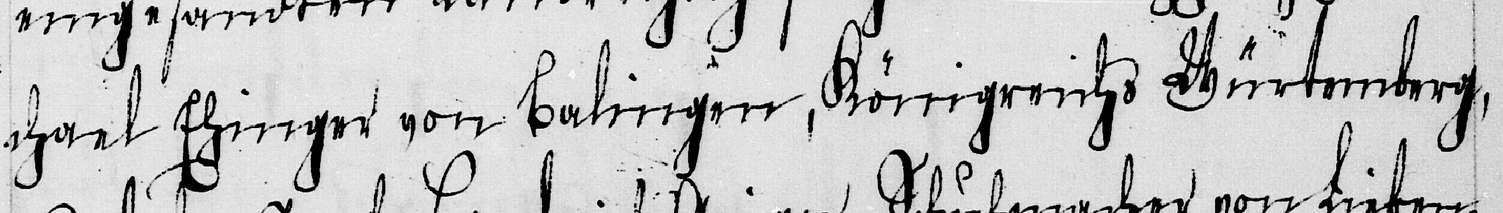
chael Ehinger von Balingen, Königreichs Würtemberg,
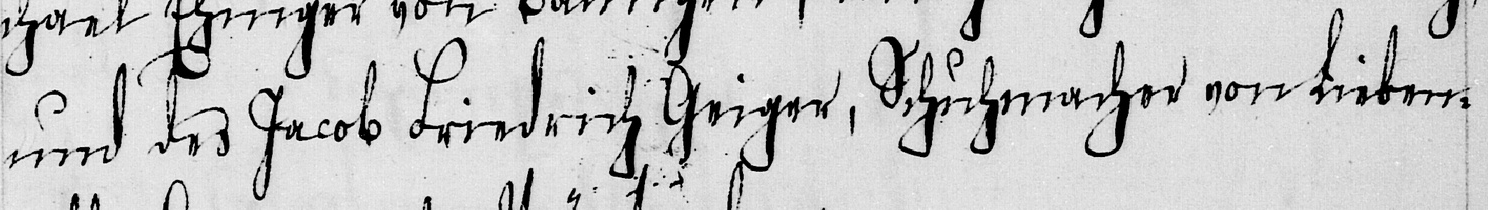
und des Jacob Friedrich Geiger, Schuhmacher von Lieben¬
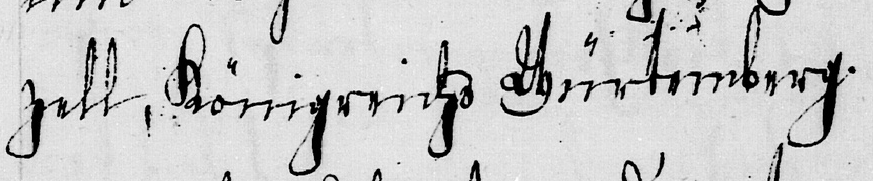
zell, Königreichs Würtemberg.
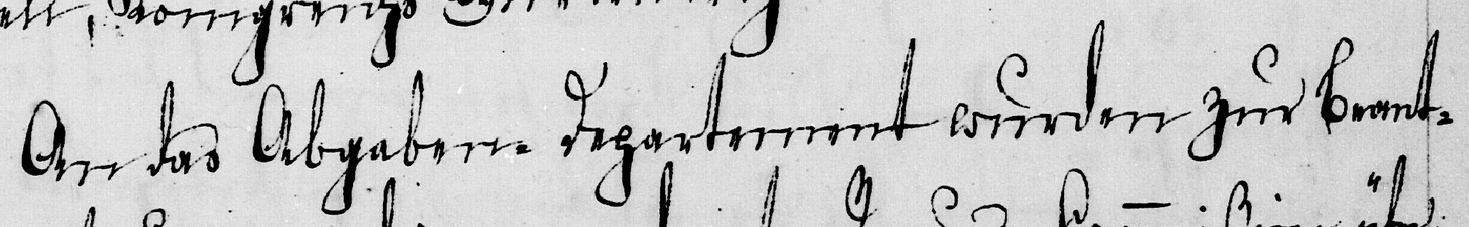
An das Abgaben-Departement wurden zur Beant¬
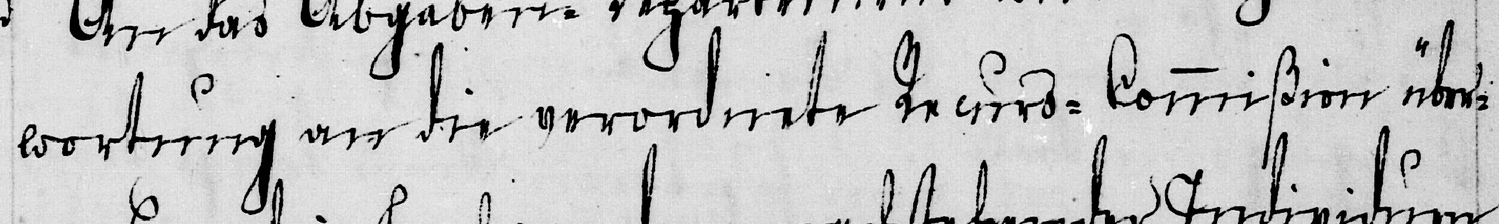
wortung an die verordnete Recurs-Commißion über¬
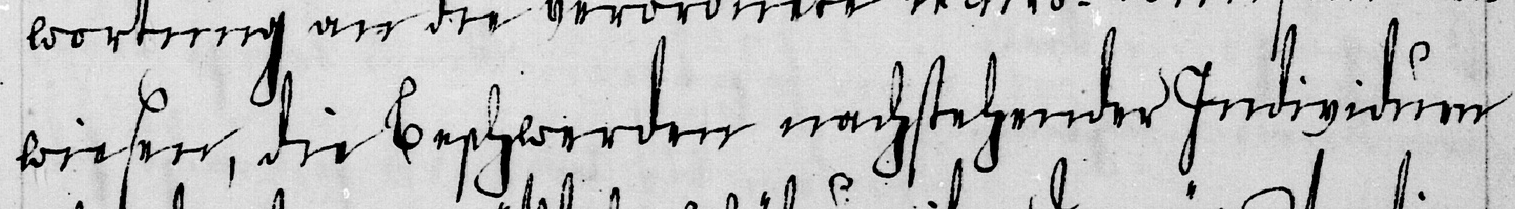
wiesen, die Beschwerden nachstehender Individuen
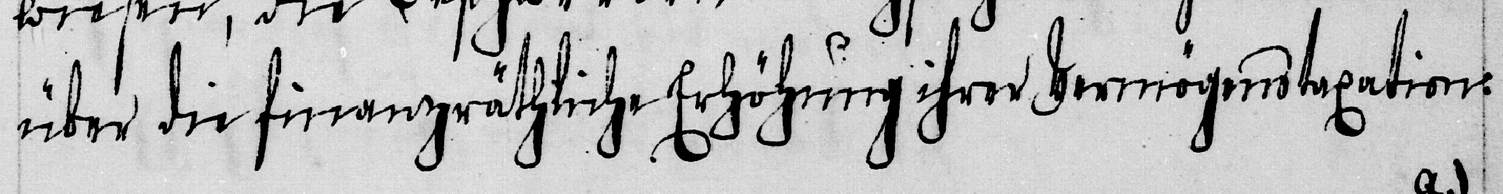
über die finanzräthliche Erhöhung ihrer Vermögenstaxation-
